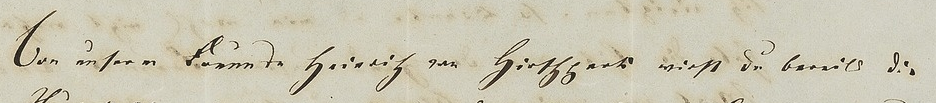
Von unserm Freunde Heinrich von Hirthpark wist du bereits die
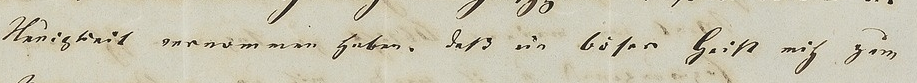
Neuigkeit vernommen haben, daß ein böser Geist mich zum
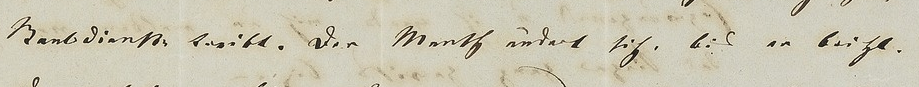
Staatsdienste treibt. Der Mensch ändert sich, bis er bricht.
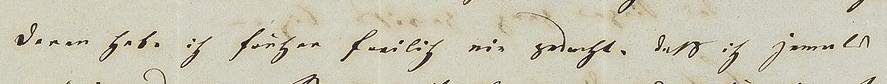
Daran habe ich früher freilich nie gedacht, daß ich jemals
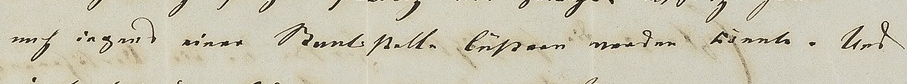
nach irgend einer Staatsstelle lüstern werden könnte. Und
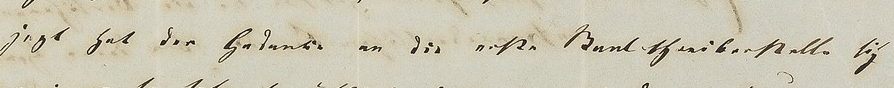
jezt hat der Gedanke an die erste Staatsschreiberstelle sich
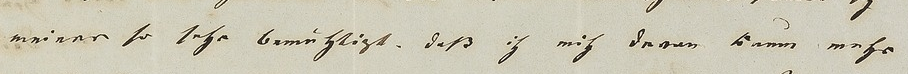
meiner so sehr bemächtigt, daß ich mich davon kaum mehr
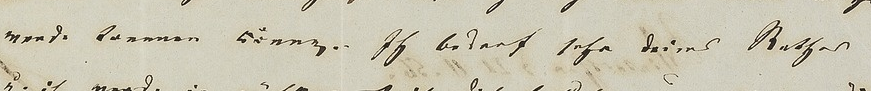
werde trennen können. Ich bedarf sehr deines Rathes
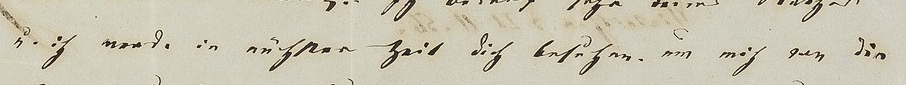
u. ich werde in nächster Zeit dich besuchen, um mich von dir
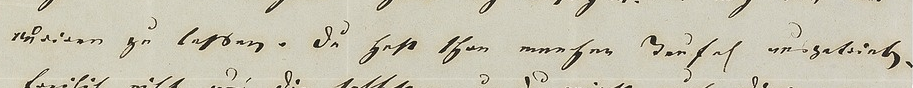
curiren zu lassen. Du hast schon manchen Teufel ausgetrieben –
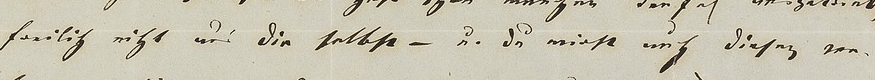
freilich nicht aus dir selbst – u. du wirst auch diesen ver-
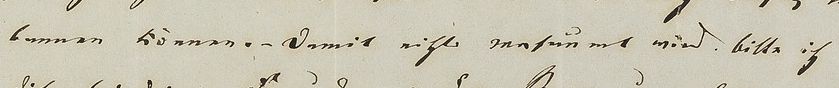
bannen können. – Damit nichts versäumt wird, bitte ich
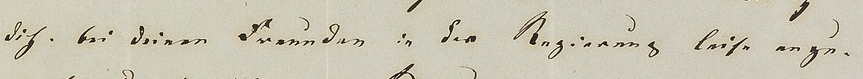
dich, bei deinen Freunden in der Regierung leise anzu-
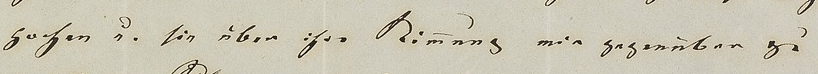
pochen u. sie über ihre Stimmung mir gegenüber zu
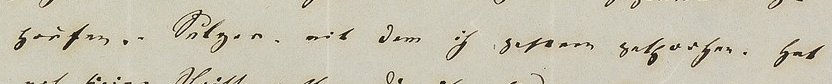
prüfen. – Sulzer, mit dem ich gestern gesprochen, hat
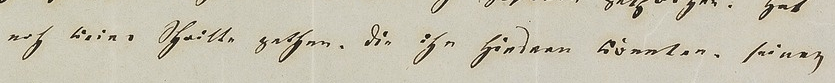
noch keine Schritte gethan, die ihn hindern könnten, seinen
